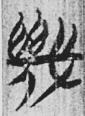幾（忌）
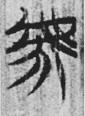{虍介}
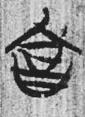合
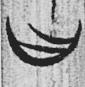曰
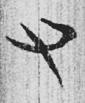又
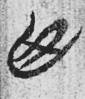臣
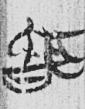○（聞）
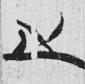之
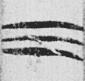三
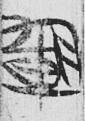軍
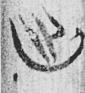出
